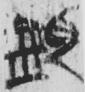欽
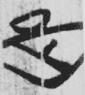是
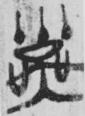○（契）
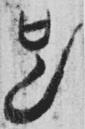也
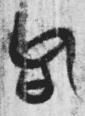句（后）
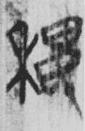稷
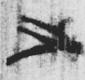之
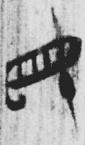母
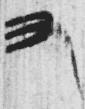又（有）
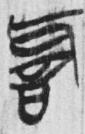詞（邰）
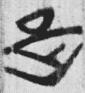是（氏）
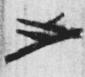之
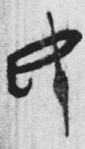女
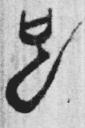也
